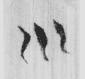川
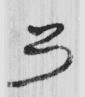乃
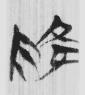降
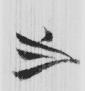之
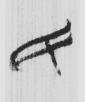民
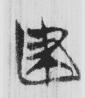建
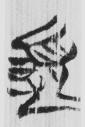{日又頁}
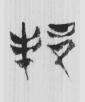邦
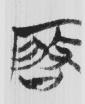啟
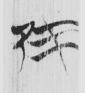隹
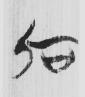后
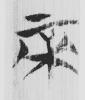帝
